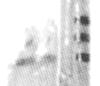三
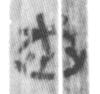本B（本）
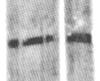一
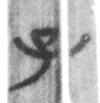子
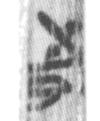時
